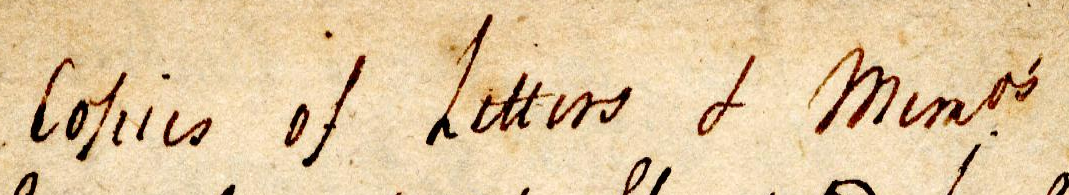Copies of Letters & Memo^s
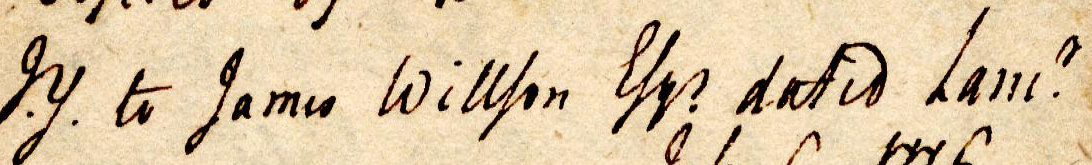J.Y. to James Wilson Esq^e dated Lanc^r
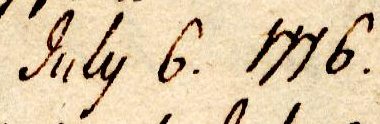July 6. 1776
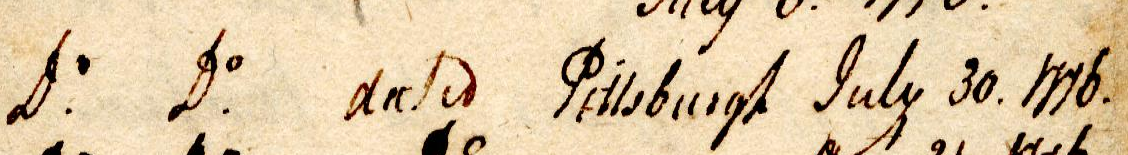D^o: D^o. dated Pittsburgh July 30. 1776.
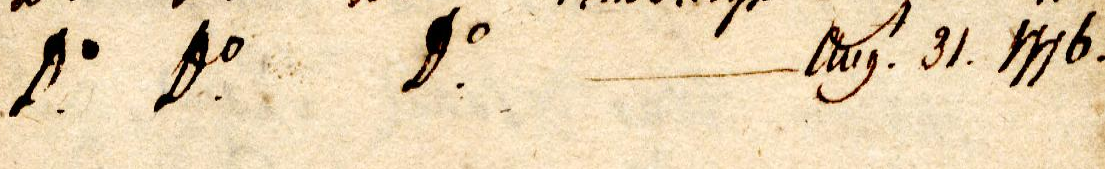D^o. D^o. D^o. Aug^t. 31. 1776.
